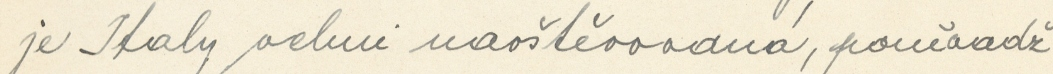je Italy velmi navštěvovaná, poněvadž
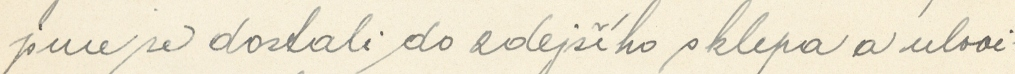jsme se dostali do zdejšího sklepa a ulovi-
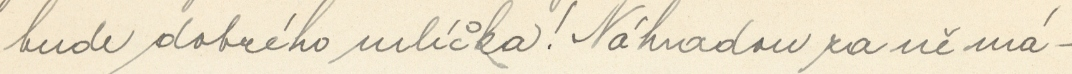bude dobrého mlíčka. Náhradou za ně má-
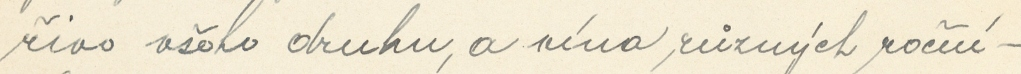řivo všeho druhu, a vína různých roční-
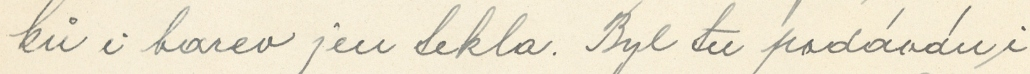ků i barev jen tekla. Byl tu podáván i
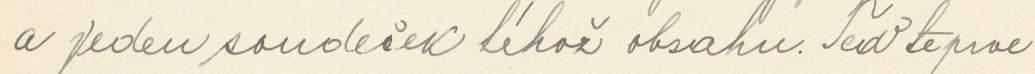a jeden soudeček téhož obsahu. Teď teprve
